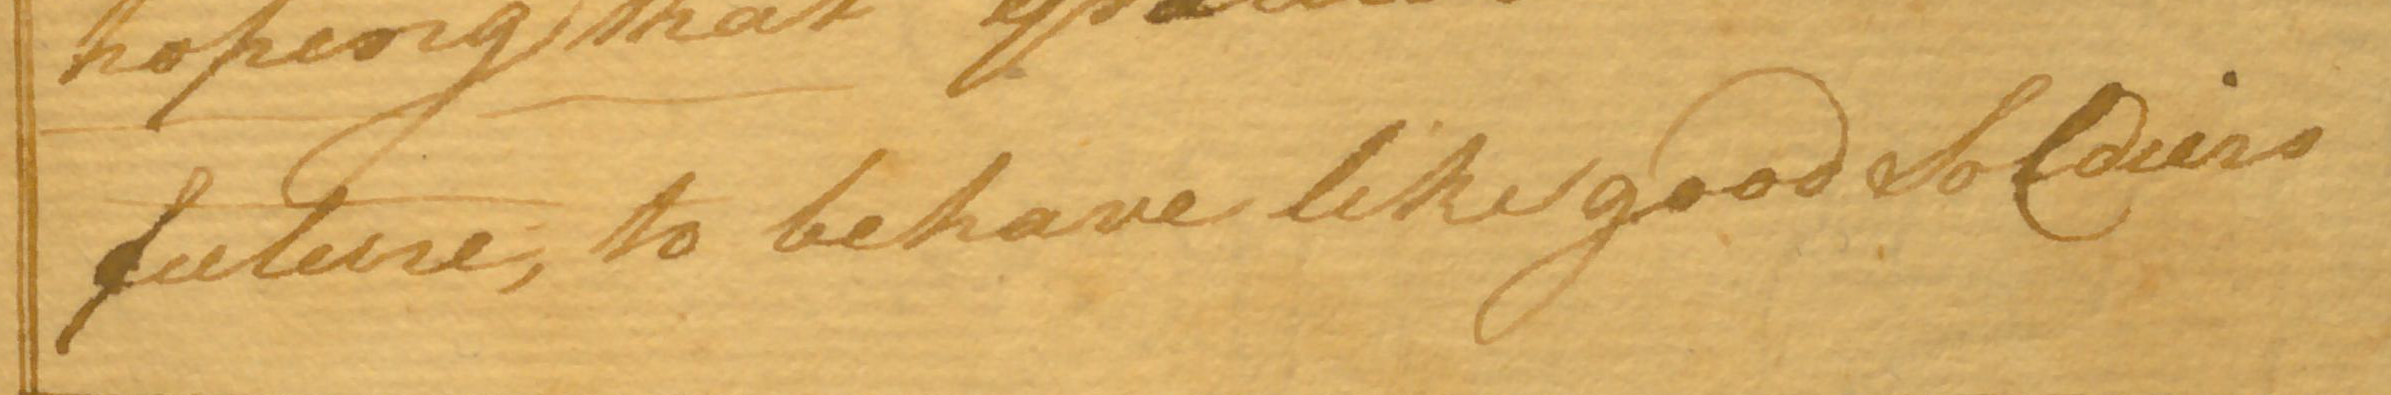future, to behave like good Soldiers
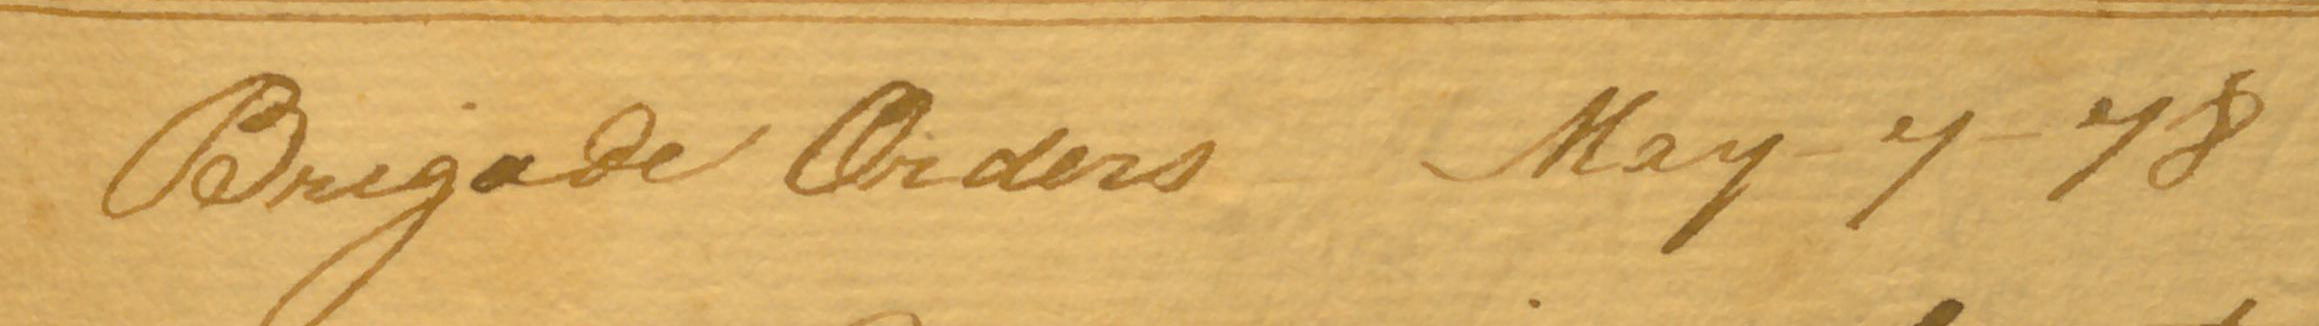Brigade orders May 7 78
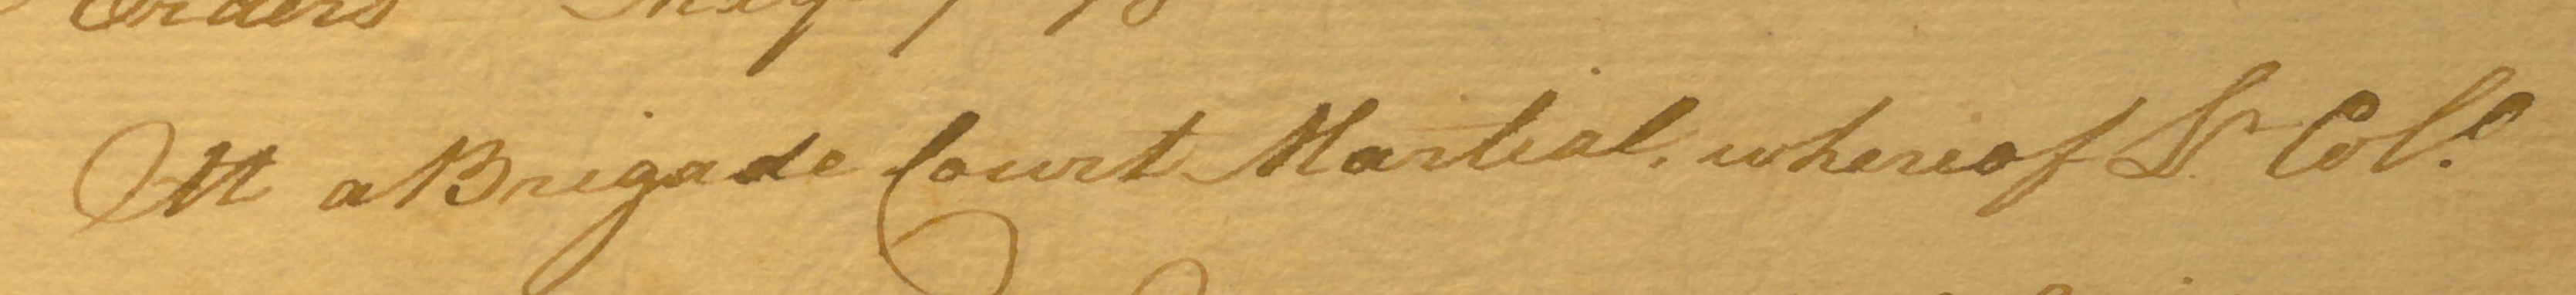At a brigade Court Martial whereof L^t. Col^o.
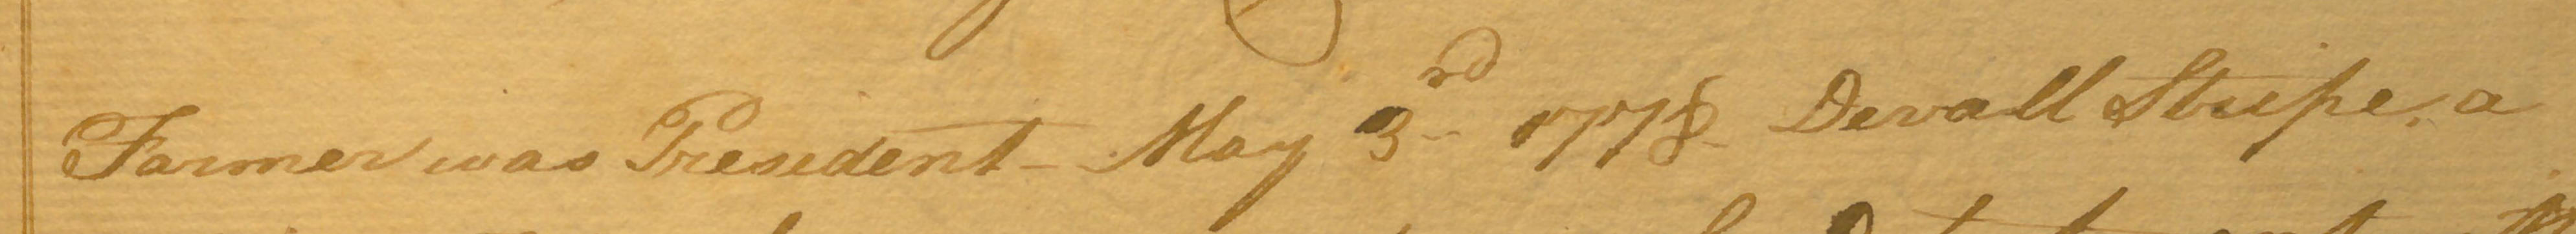Farmer was President May 3^rd 1778 Devall Stripe a
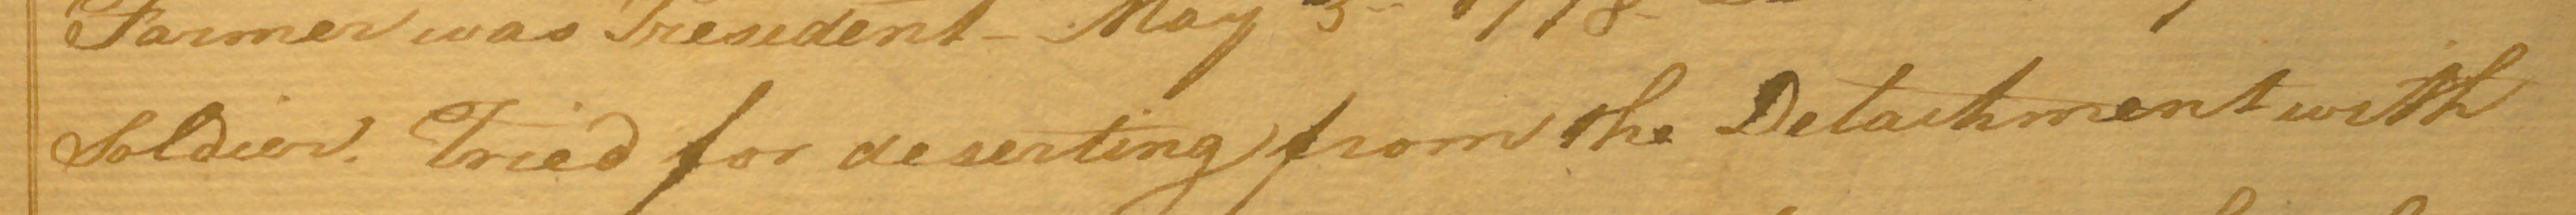Soldier. Tried for deserting from the Detachment with
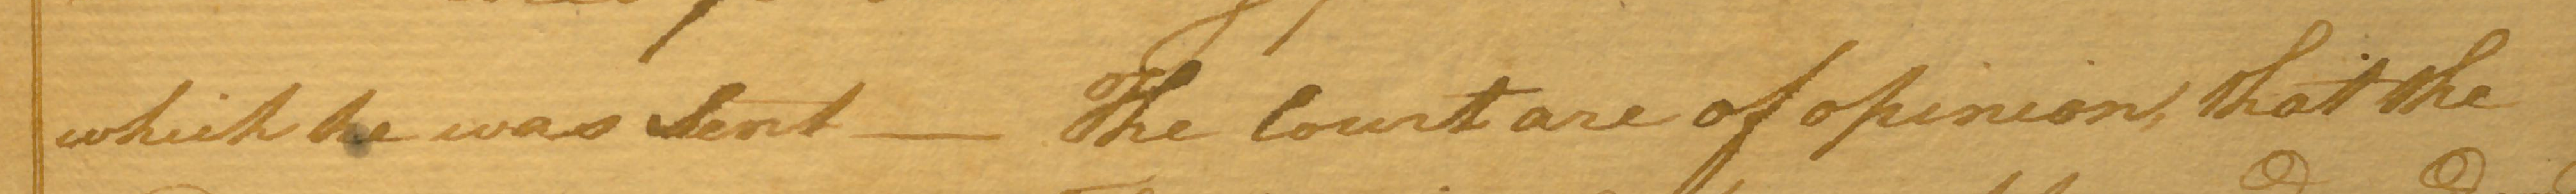which he was Sent- The Court are of opinion, that the
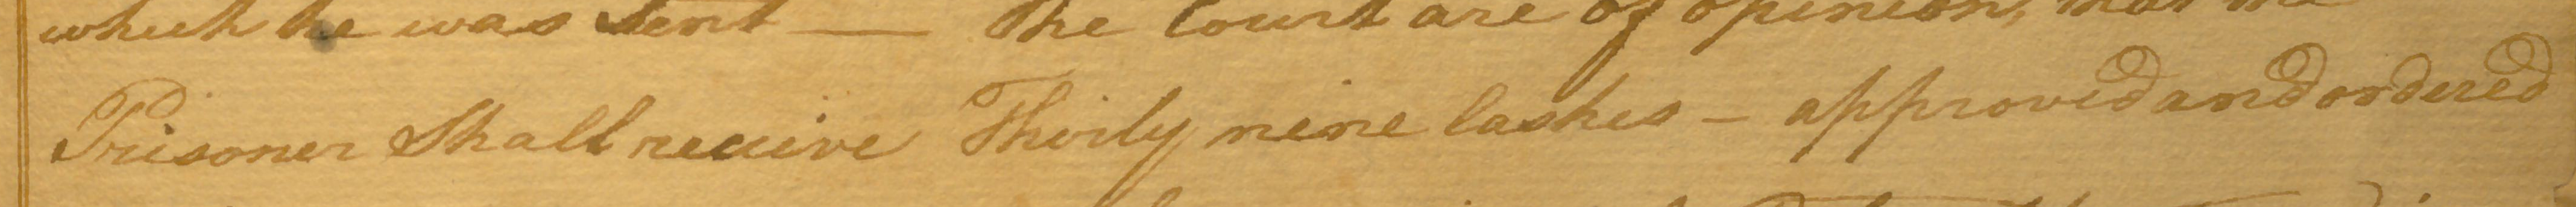Prisoner Shall receive Thirty nine lashes- approved and ordered
